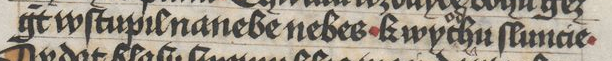ḡt wſtupil nanebe nebes.kwyodchu ſluncie.
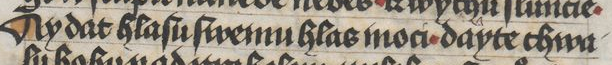Ay dat hlaſu ſwemu hlas moci.dayte chwa¬
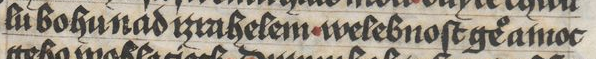lu bohu nad izrahelem welebnoſt geo a moc
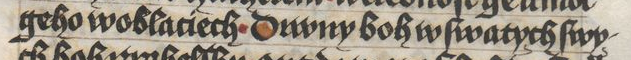geho woblaciech.Drwny boh wſwatych ſwy¬
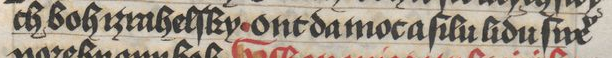ch bóh izrahelſky.ont da moc a ſilu lidu ſwev
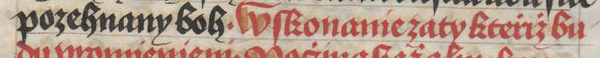pozehnany bóh.Wſkonanie zaty kteṙiż bu¬
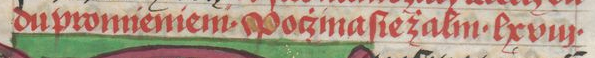du promienieni.Pocżina ſie żalm.lxviii.
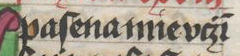paſena mie vċżī
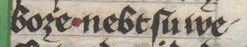boże.nebṫ ſu we¬
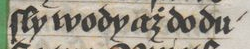ſly wody aż do du¬
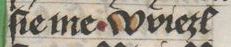ſie me.Vviezl
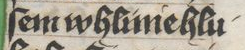ſem whlinie hlu¬
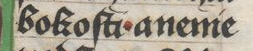bokoſti.a nenie¬
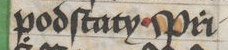podſtaty.Pṙi¬
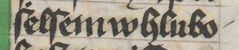ẛelſem whlubo¬
